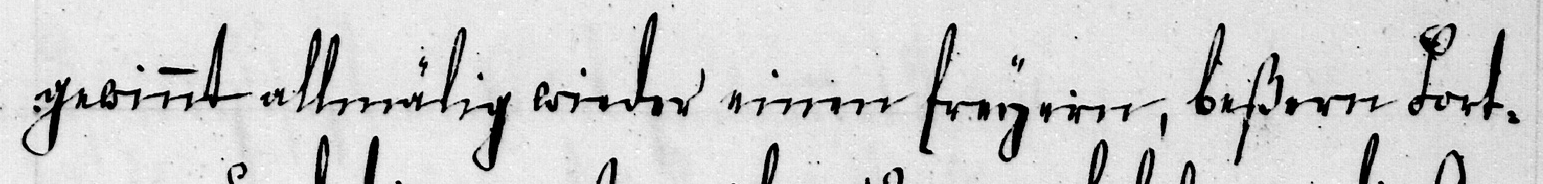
gewinnt allmälig wieder einen freyern, beßern Fort¬
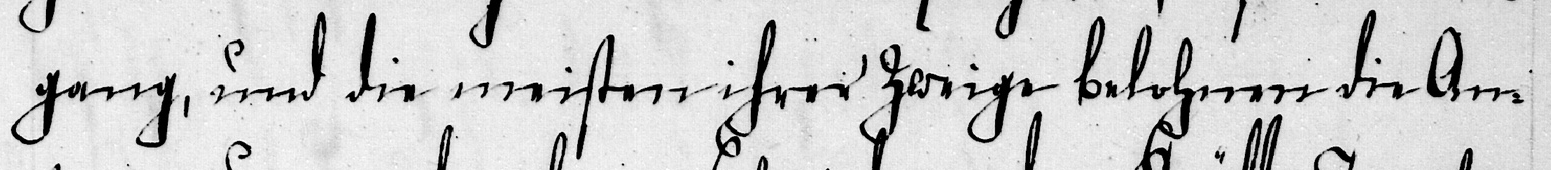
gang, und die meisten ihrer Zweige belohnen die An¬
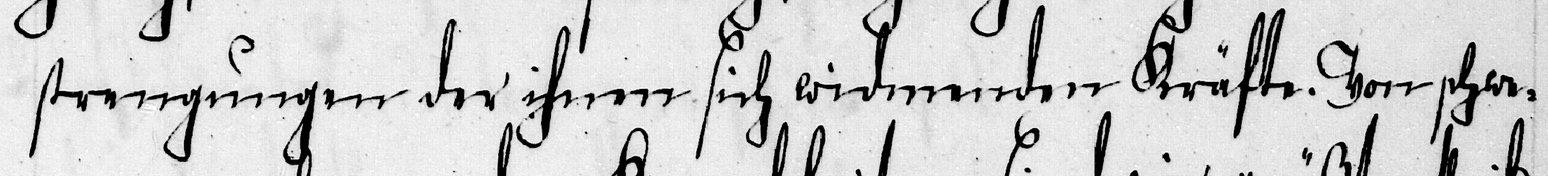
strengungen der ihnen sich widmenden Kräfte. Von schwe¬
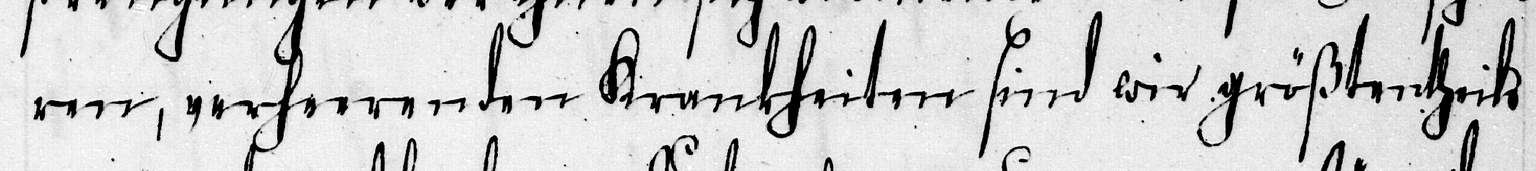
ren, verheerenden Krankheiten sind wir größtentheils
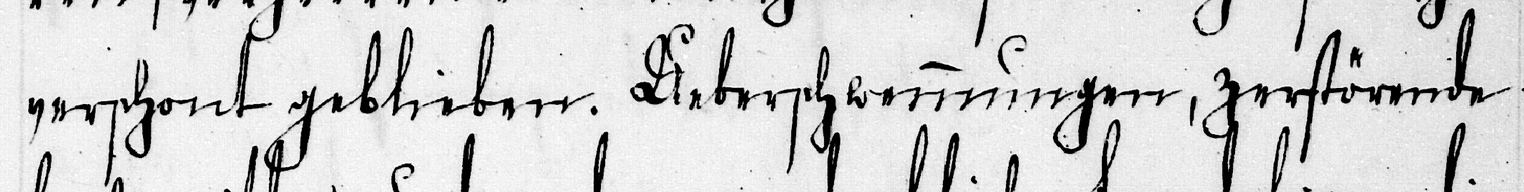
verschont geblieben. Ueberschwemmungen, zerstörende
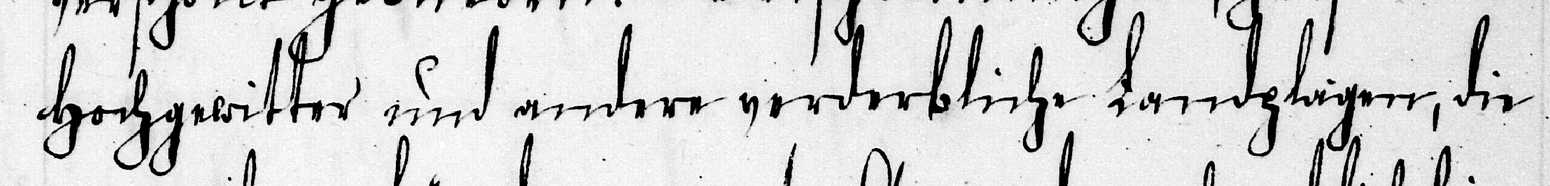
Hochgewitter und andere verderbliche Landplagen, die
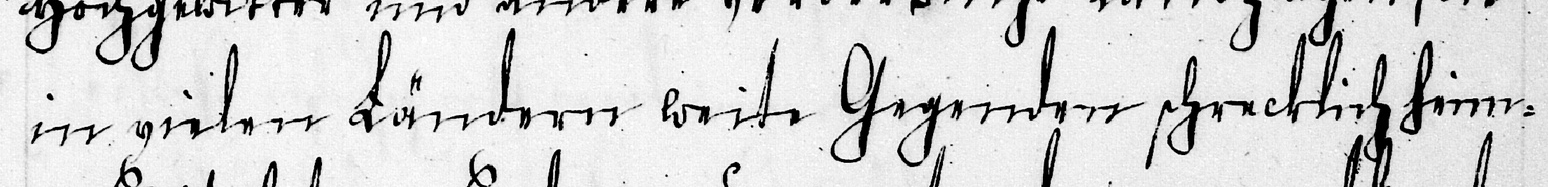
in vielen Ländern weite Gegenden schrecklich heim¬
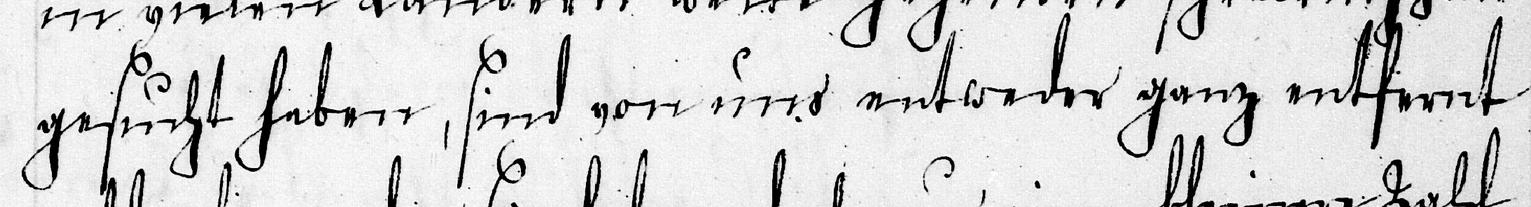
gesucht haben, sind von uns entweder ganz entfernt
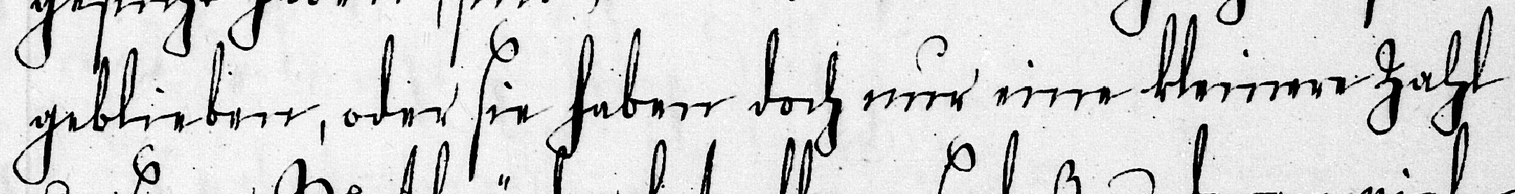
geblieben, oder sie haben doch nur eine kleinere Zahl
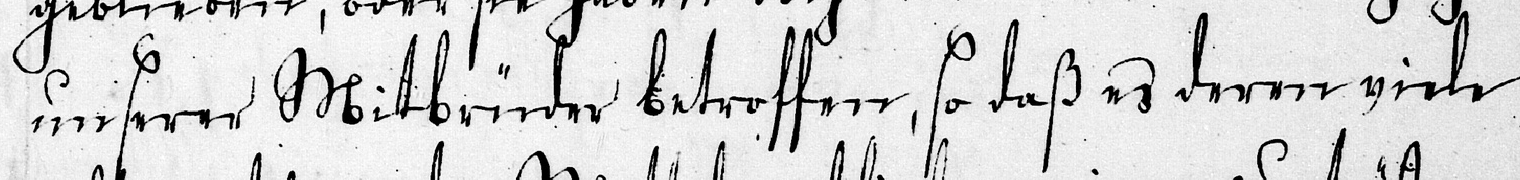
unserer Mitbrüder betroffen, so daß es deren viele
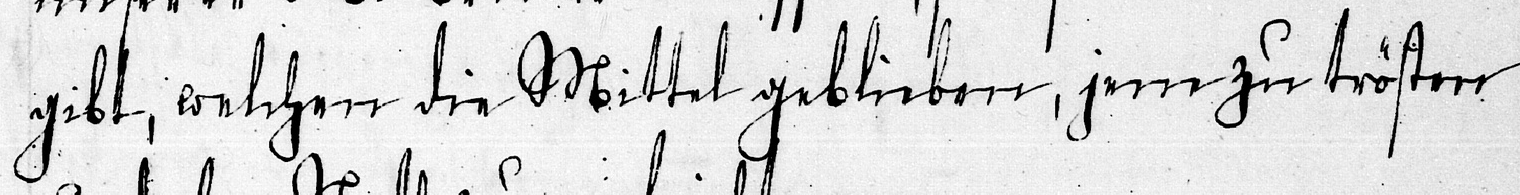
gibt, welchen die Mittel geblieben, jene zu trösten
